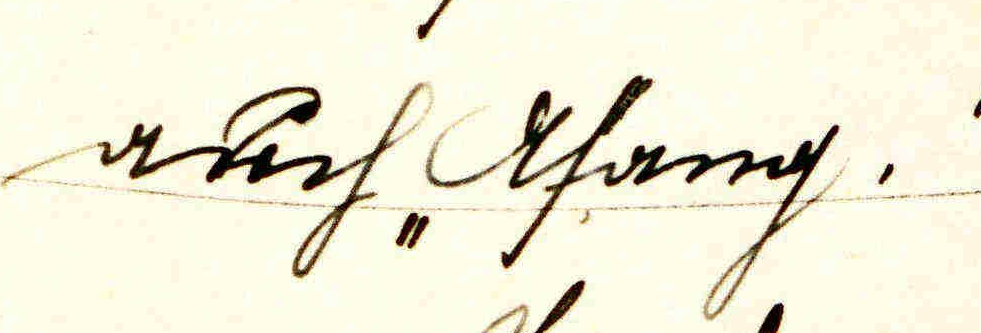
auch "Afang".
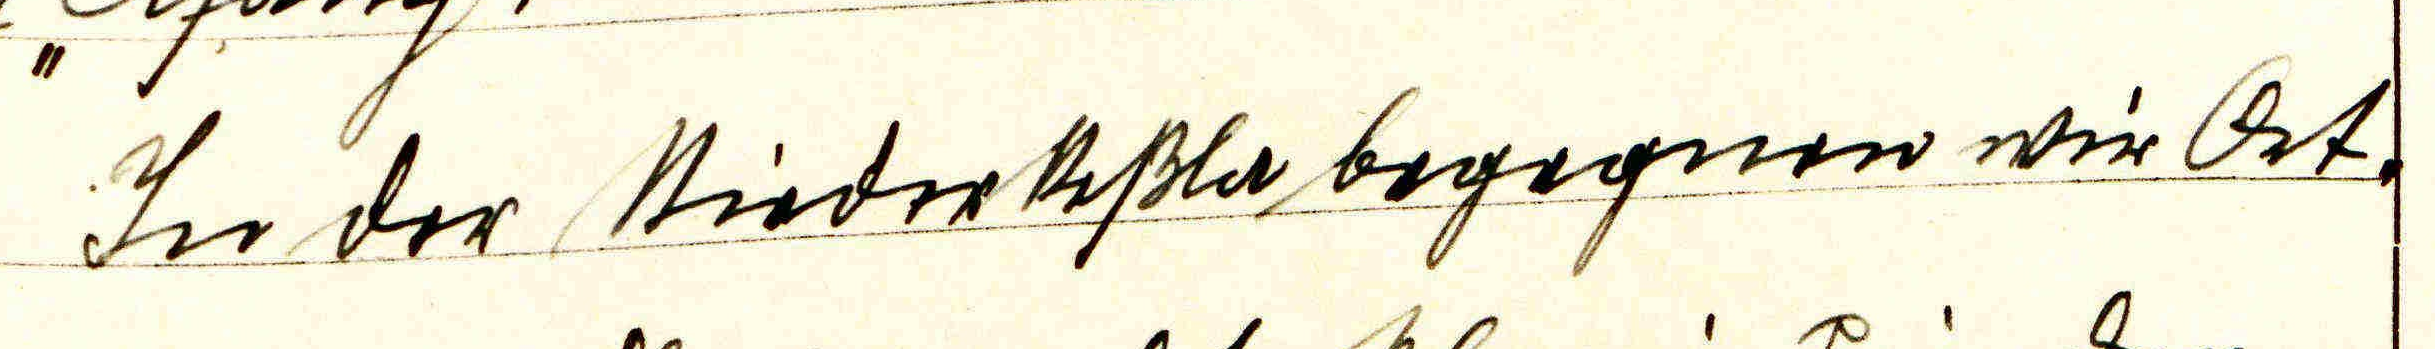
In der Niederkeßla begegnen wir Ort-
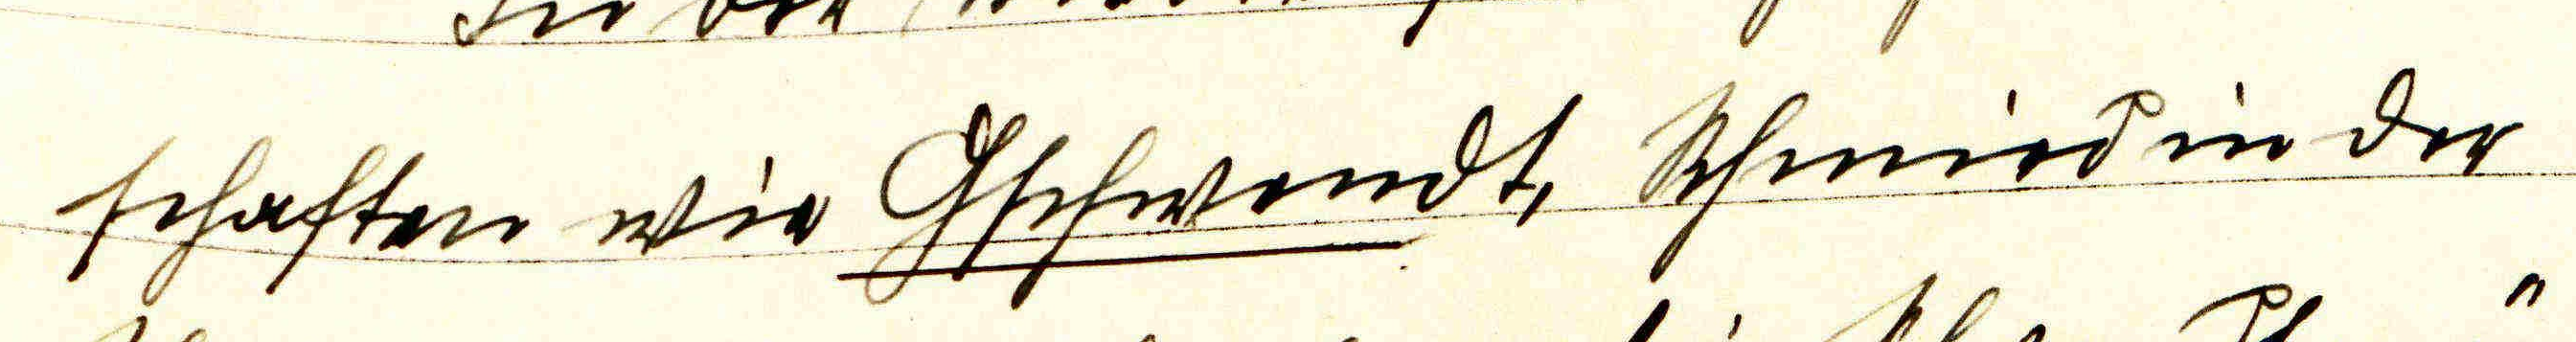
schaften wie Gschwendt, Schmied in der
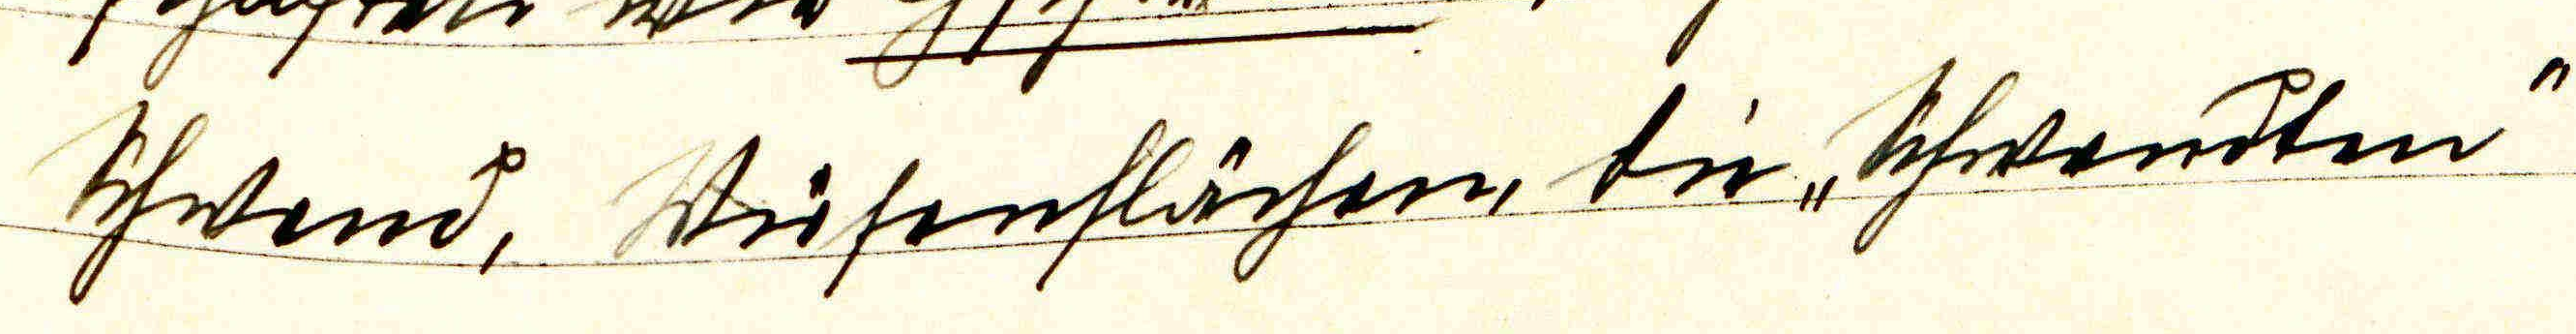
Schwend, Wiesenflächen die "Schwendten"
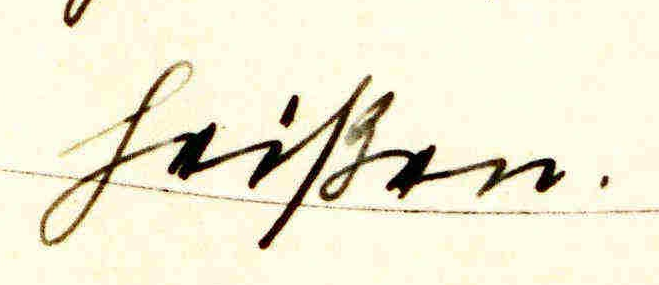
heißen.
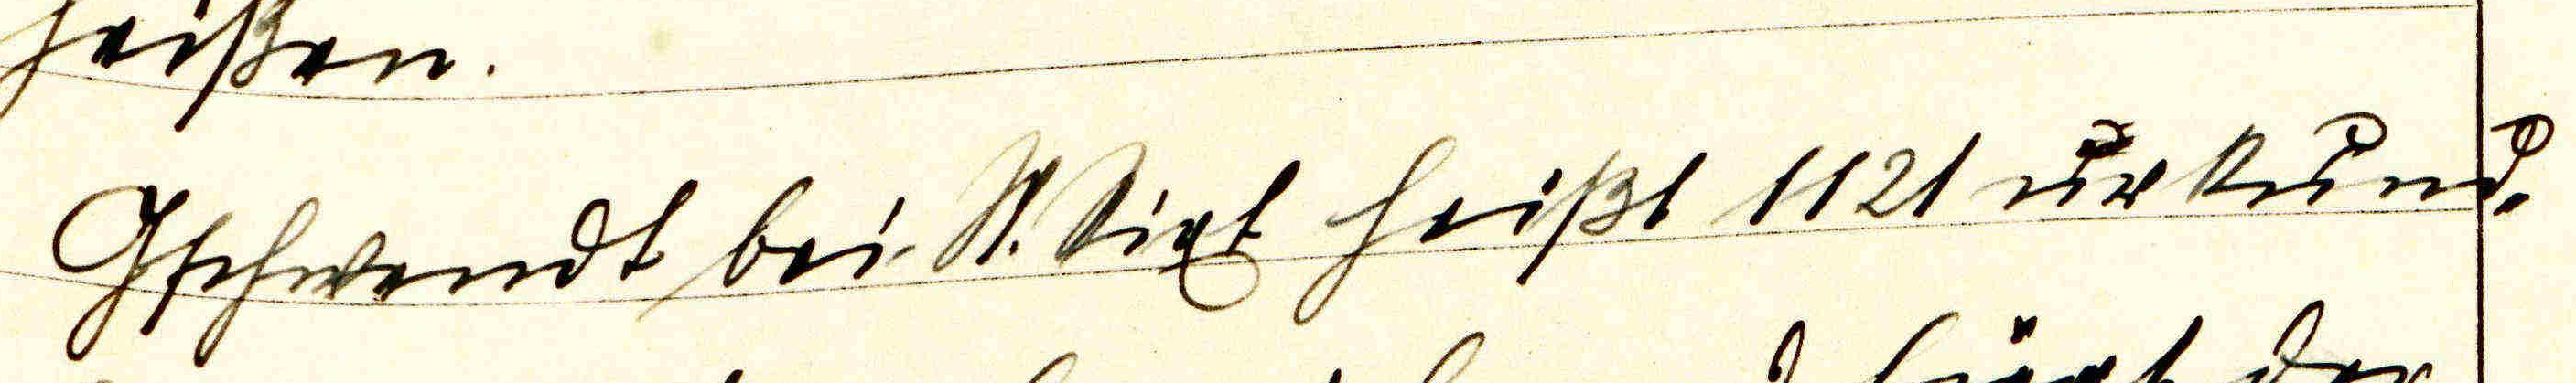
Gschwendt bei St. Sixt heißt 1121 urkund-
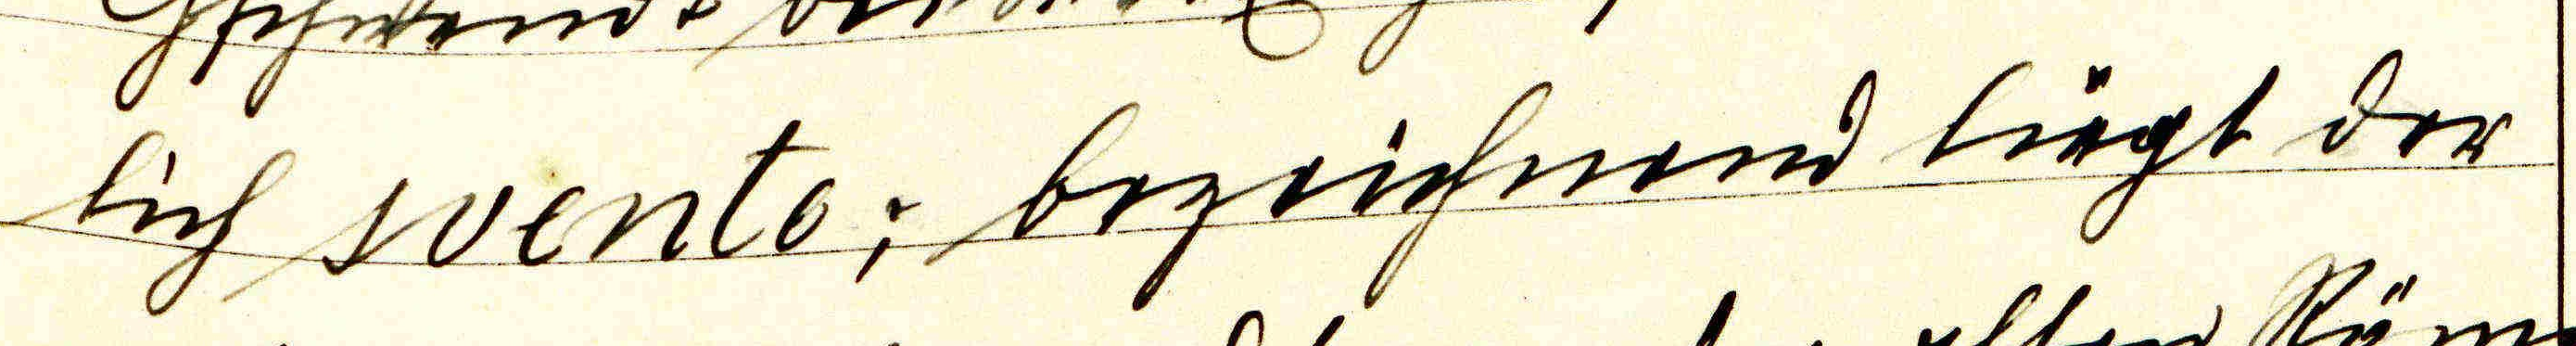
lich svento; bezeichnend liegt der
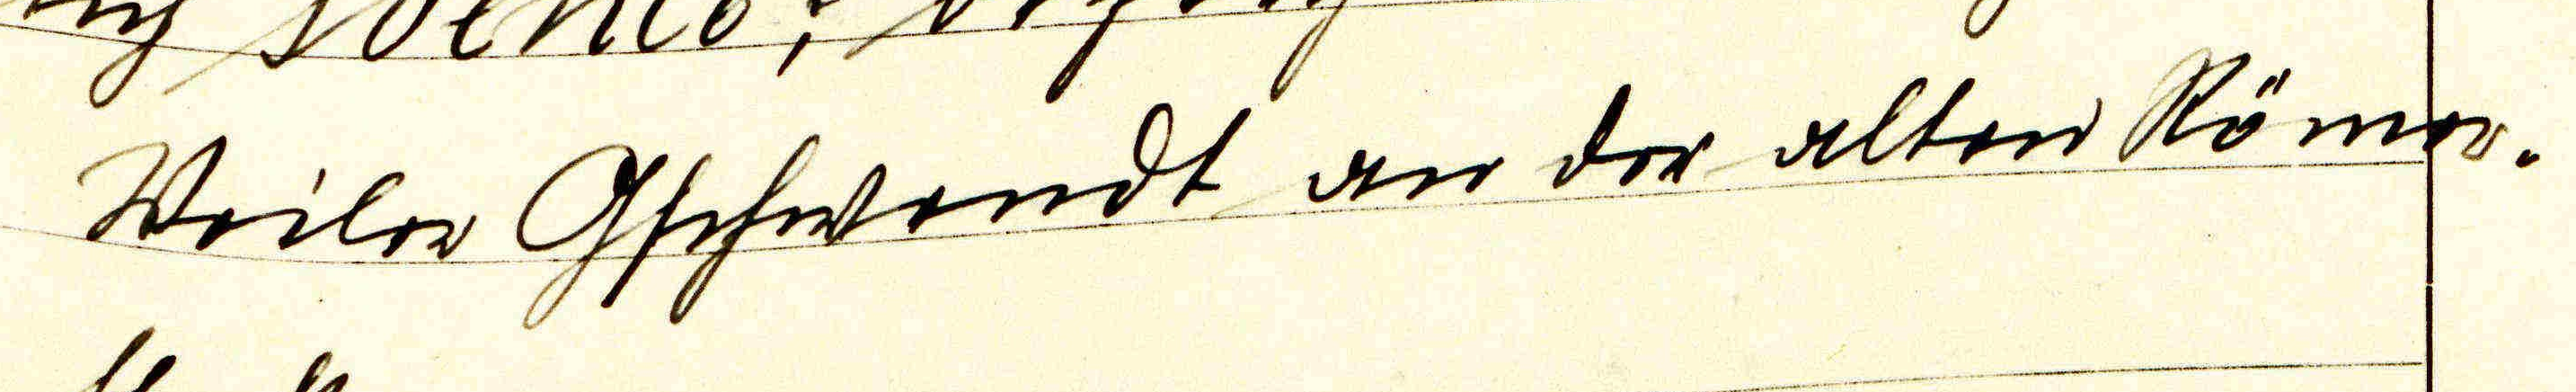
Weiler Gschwendt an der alten Römer-
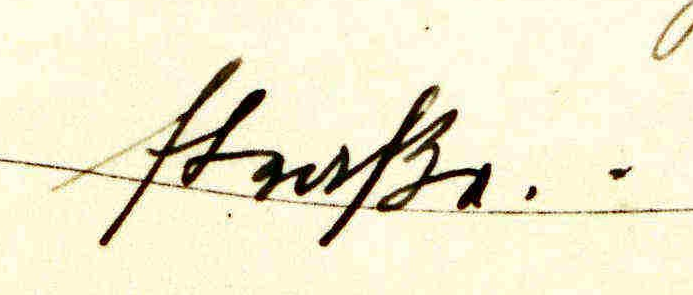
straße.
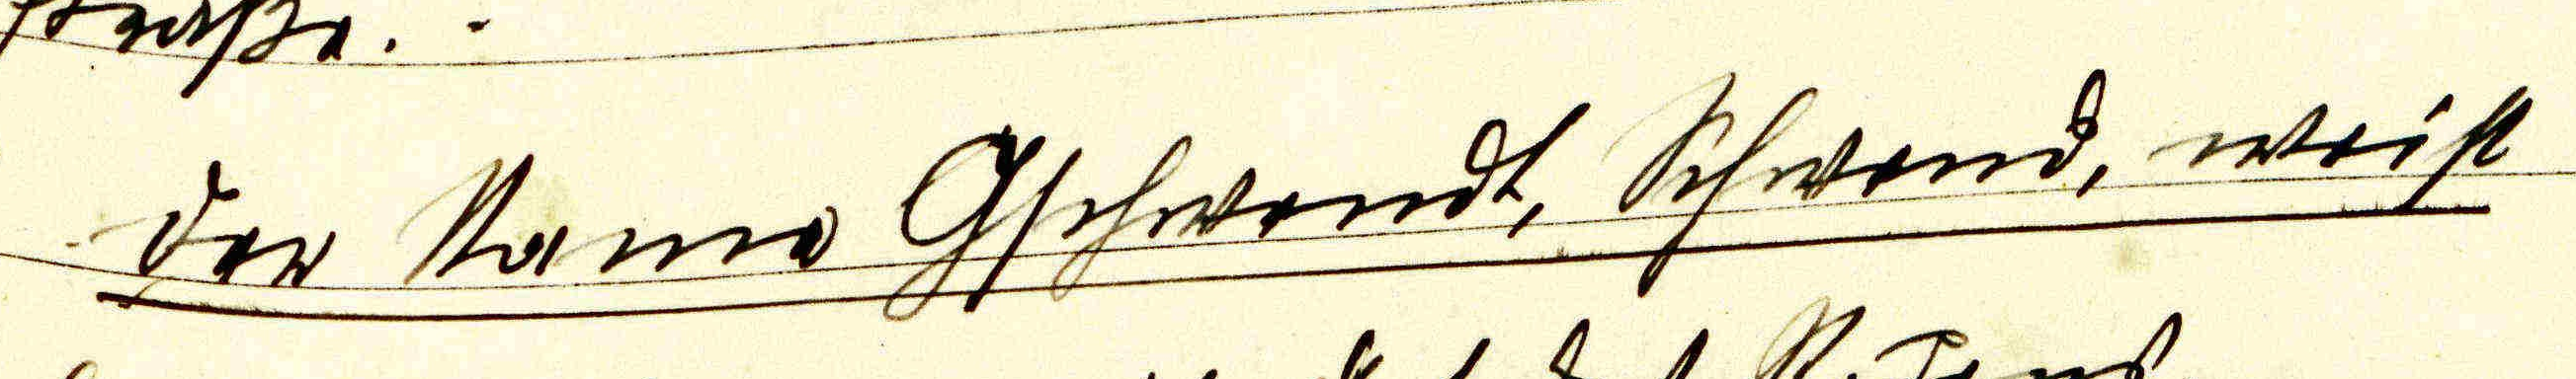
Der Name Gschwendt, Schwend, weist
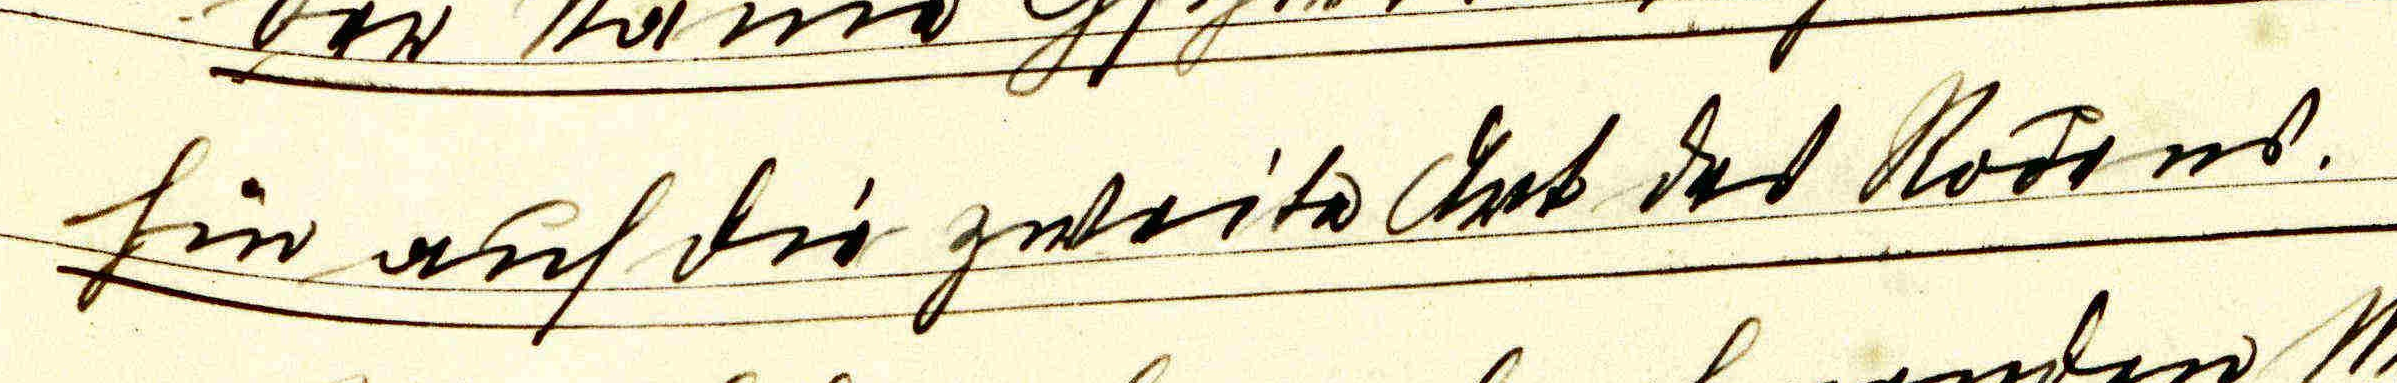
hin auf die zweite Art des Rodens.
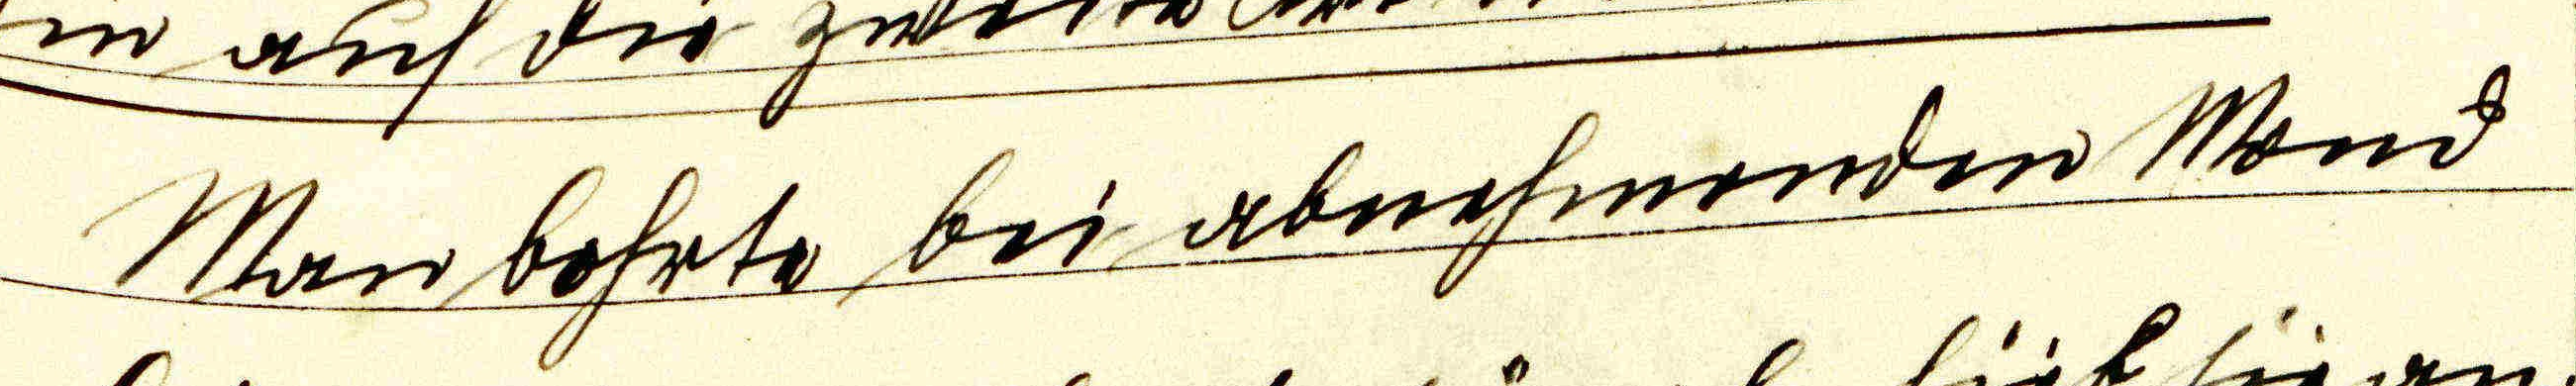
Man bohrte bei abnegmenden Mond
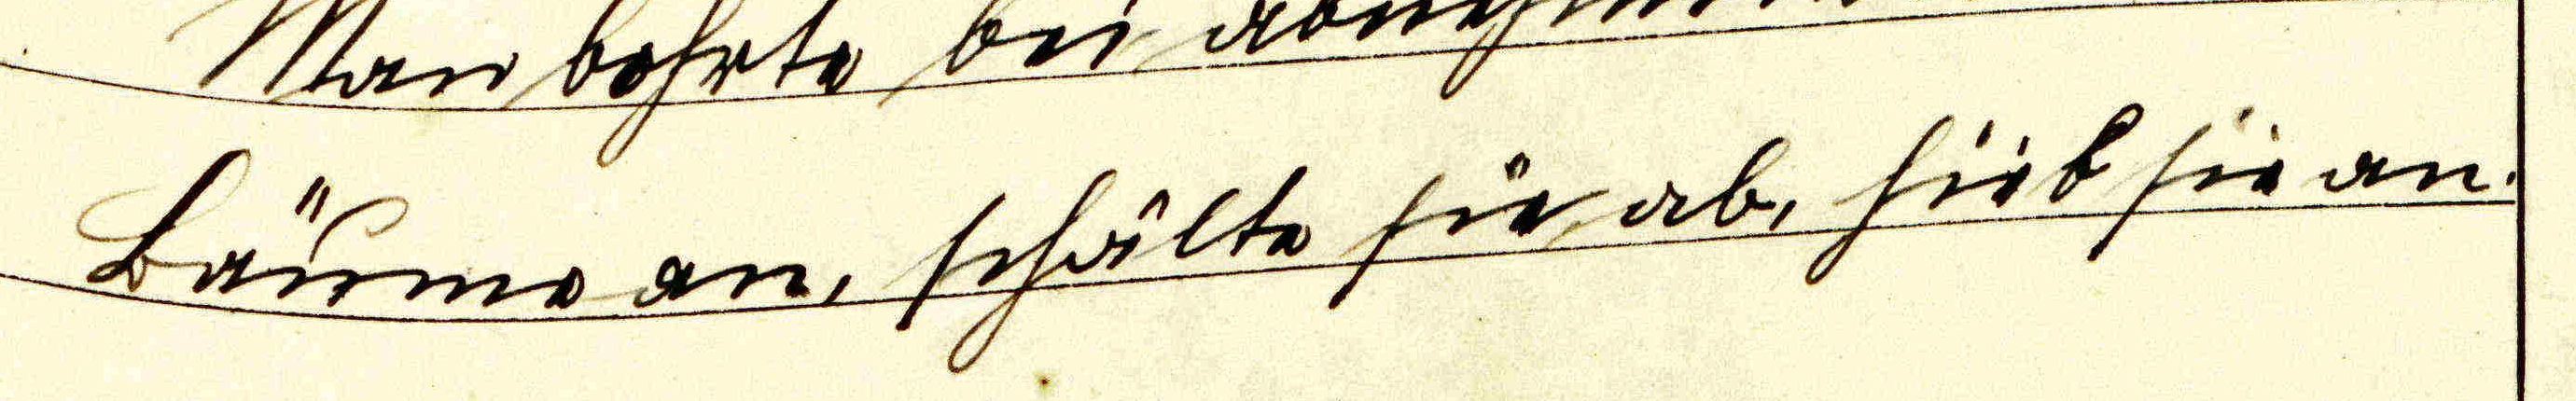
Bäume an, schälte sie ab, hieb sie an
